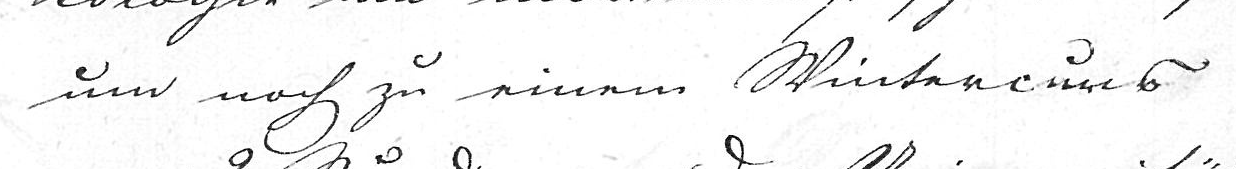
um noch zu einem Wintercurs
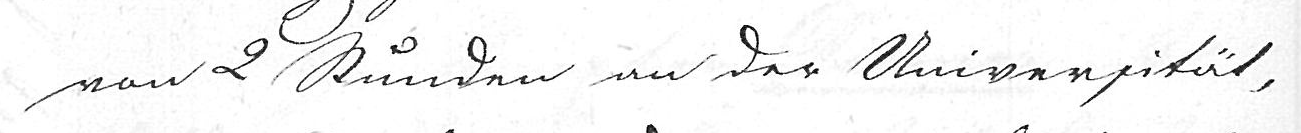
von 2 Stunden an der Universität,
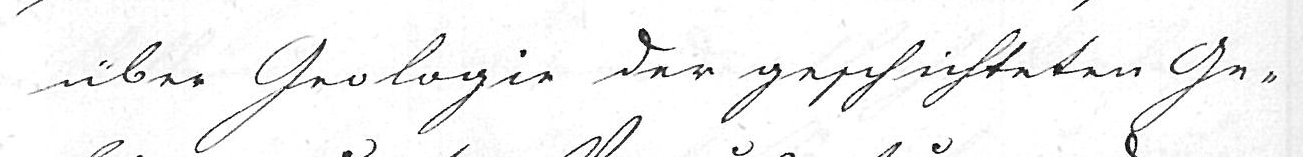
über Geologie der geschichteten Ge-
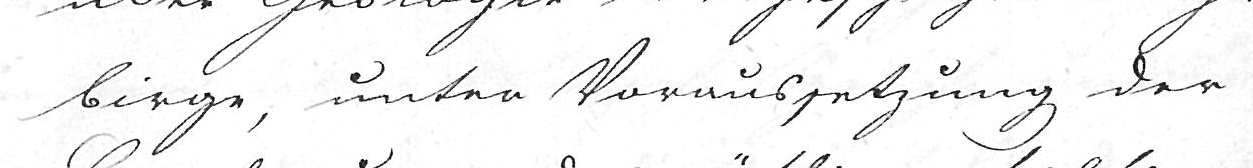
birge unter Voraussetzung der
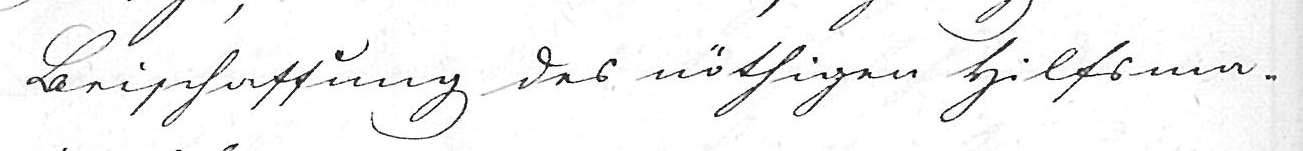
Beischaffung des nöthigen Hilfsma-
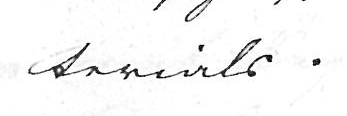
terials.
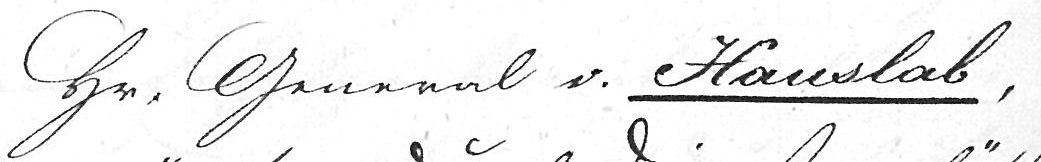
Hr. General v. Hauslab
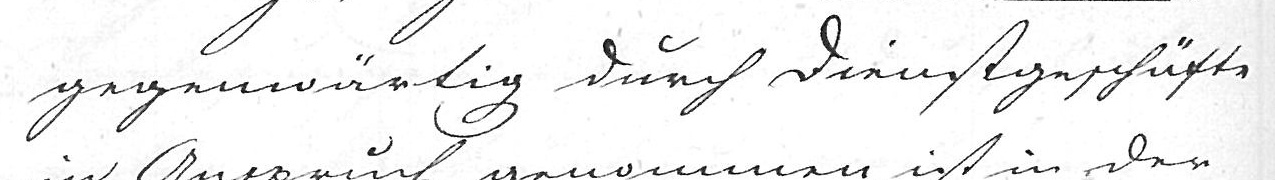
gegenwärtig durch Dienstgeschäfte
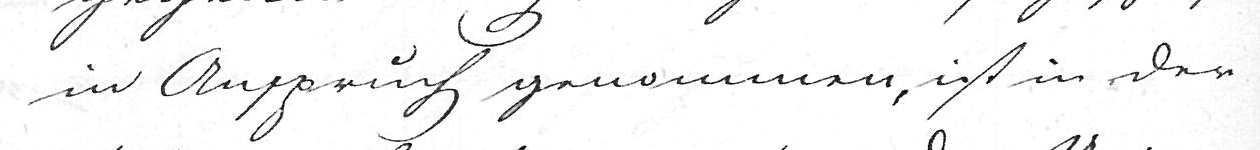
in Anspruch genommen, ist in der
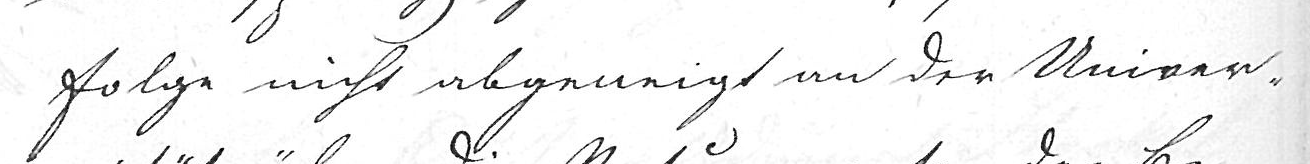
Folge nicht abgeneigt an der Univer-
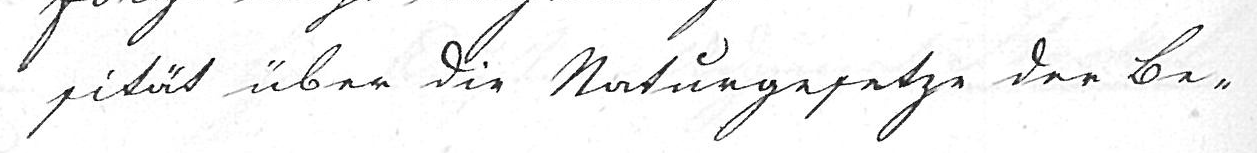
sität über die Naturgesetze der Be-
